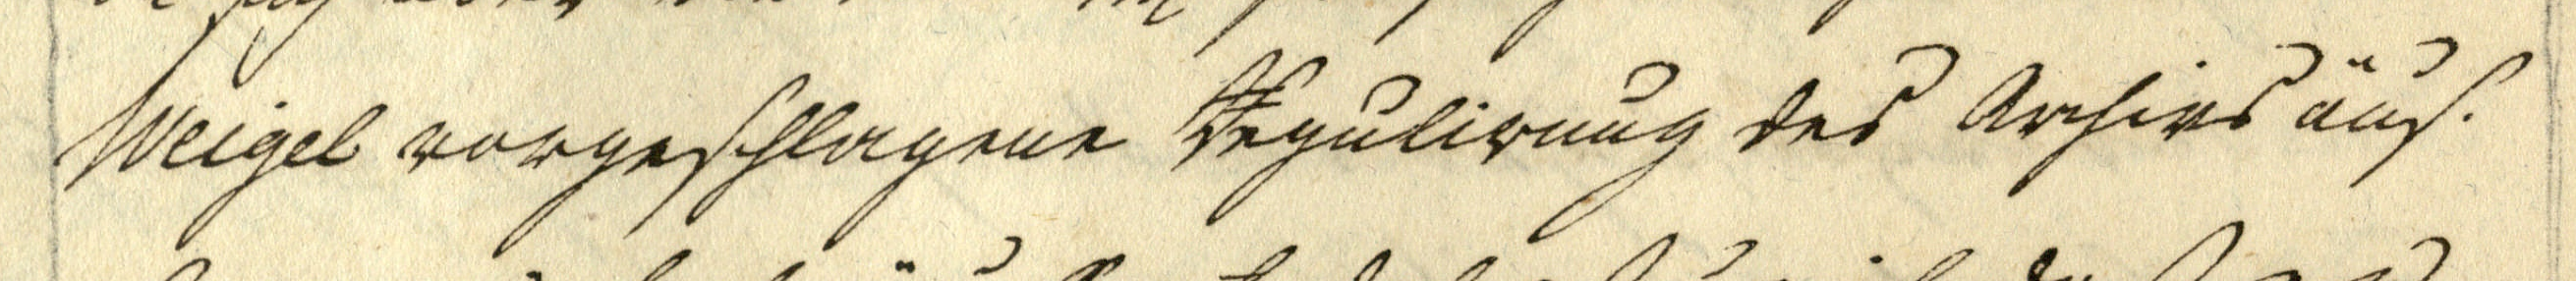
Weigel vorgeschlagene Regulirung des Archivs äus¬
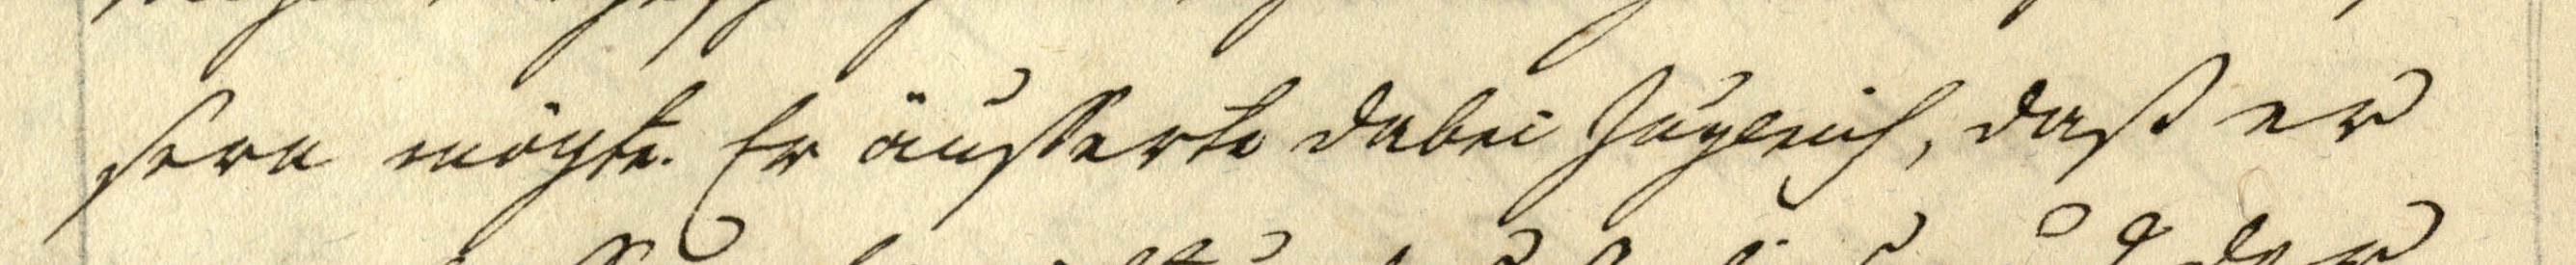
sern mögte. Er äusserte dabei zugleich, daß er
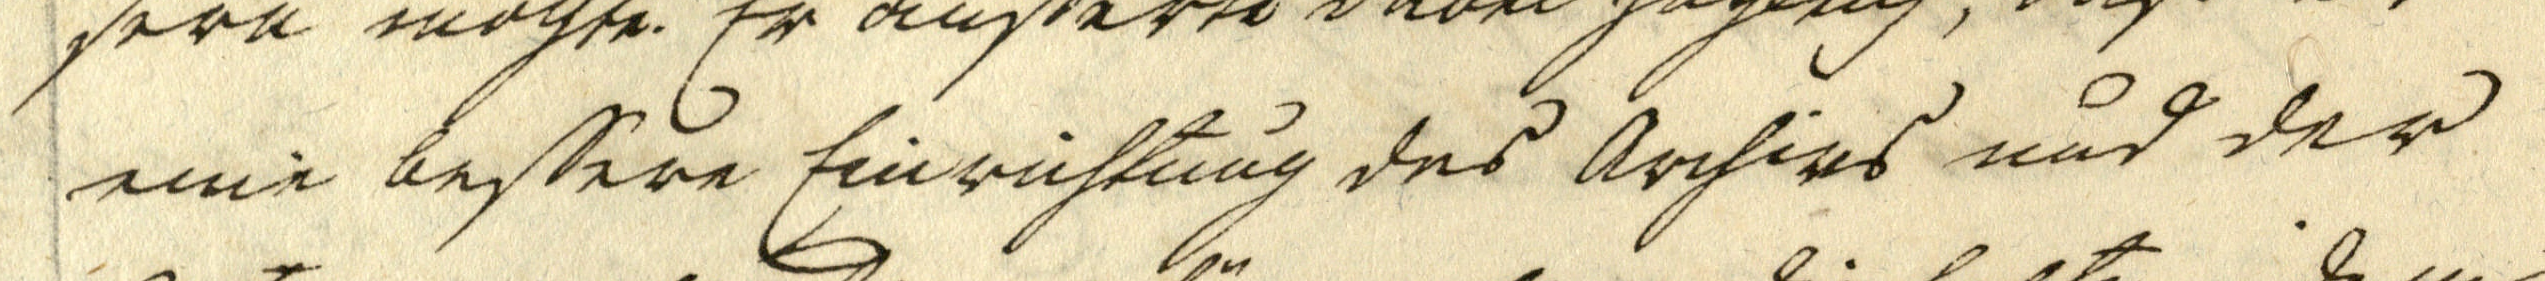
eine bessere Einrichtung des Archivs und der
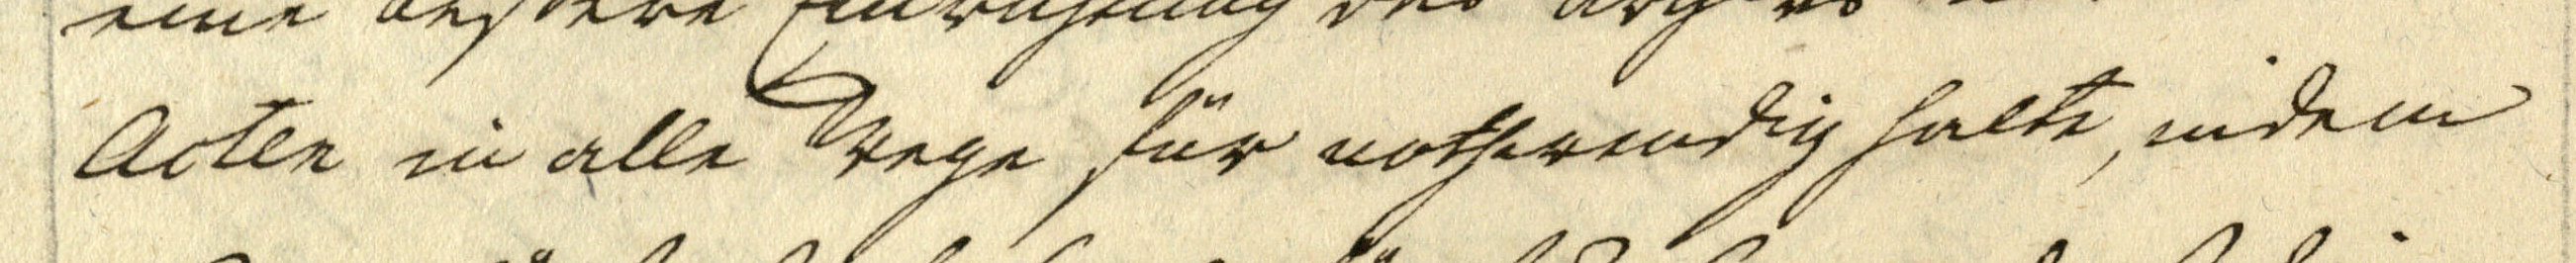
Acten in alle Wege für nothwendig halte, indem
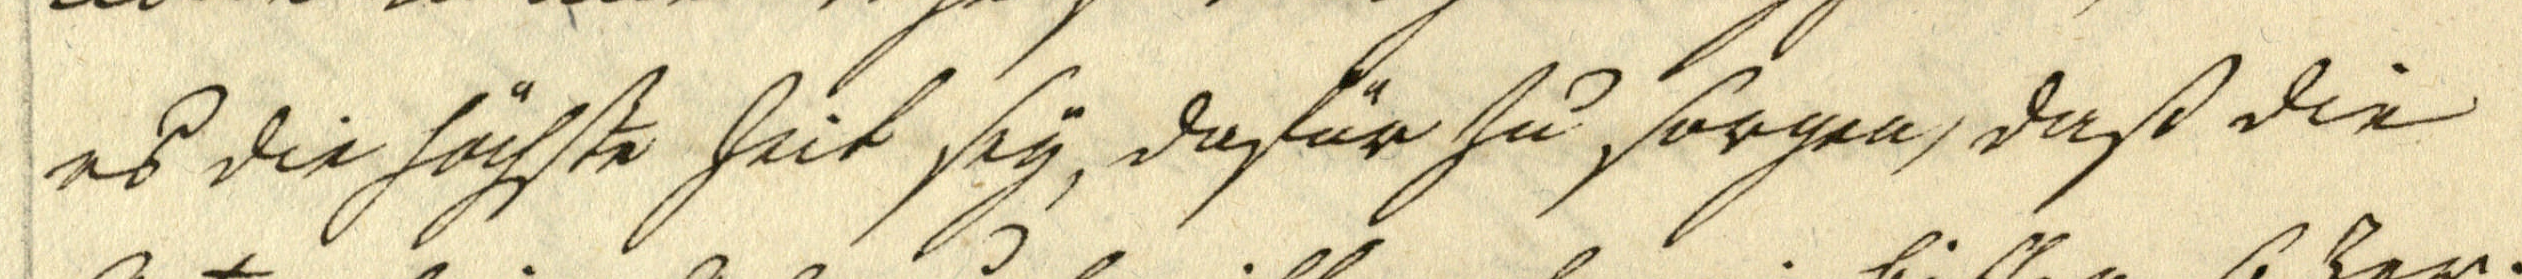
es die höchste Zeit seÿ, dafür zu sorgen, daß die
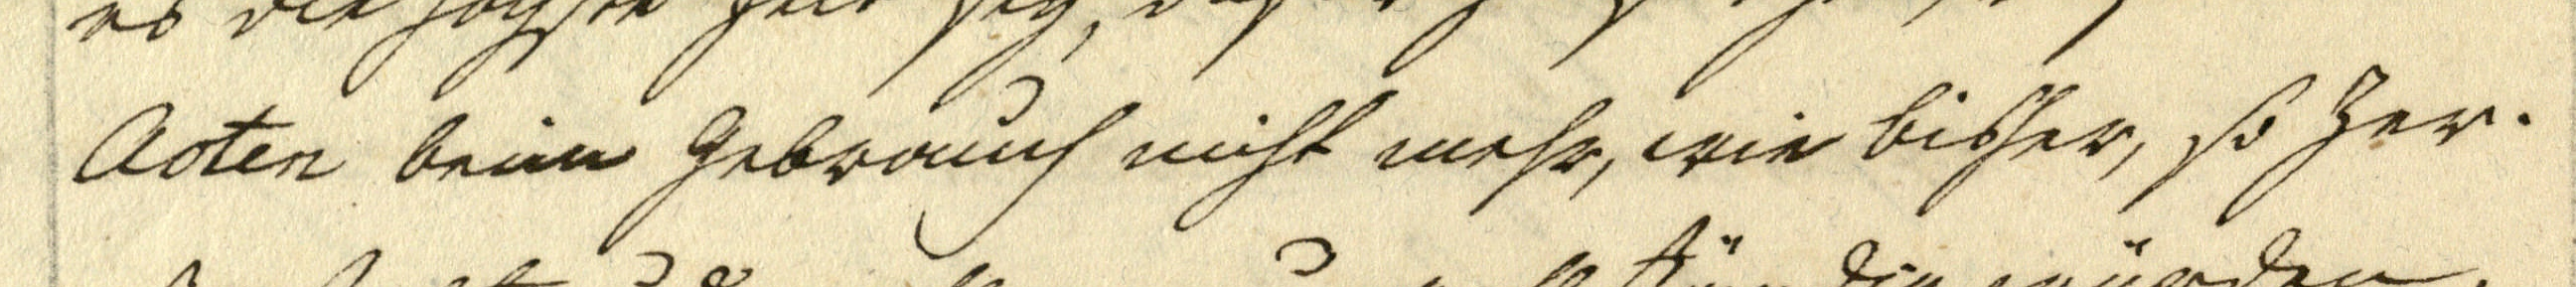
Acten beim Gebrauch nicht mehr, wie bisher, so zer¬
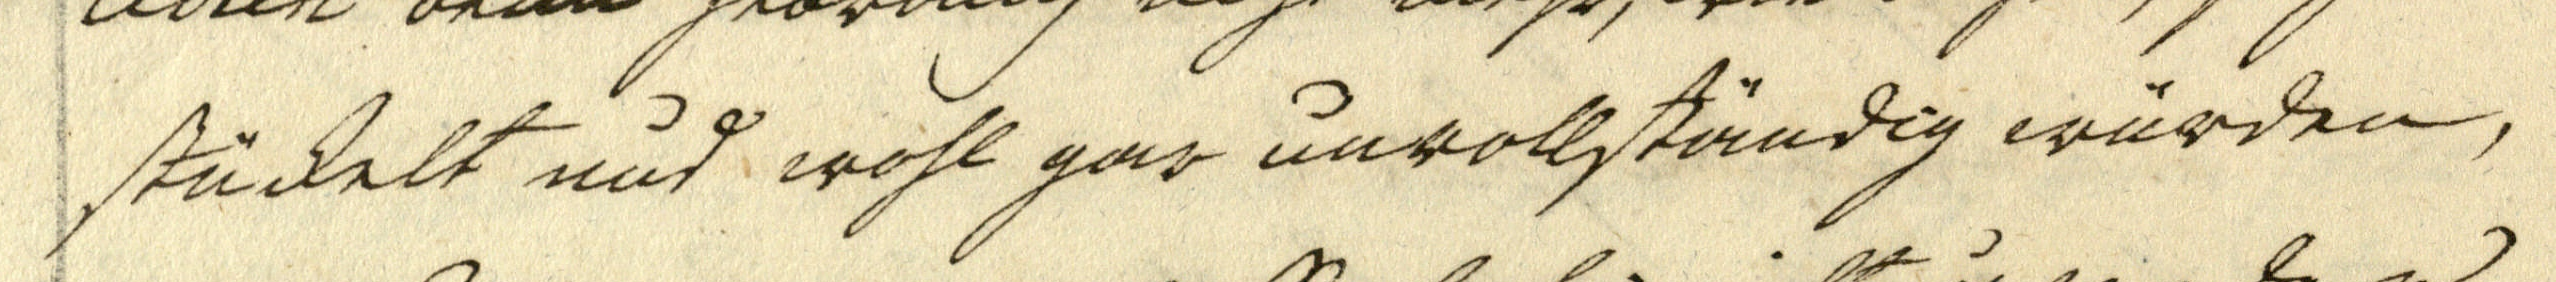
stückelt und wohl gar unvollständig würden,
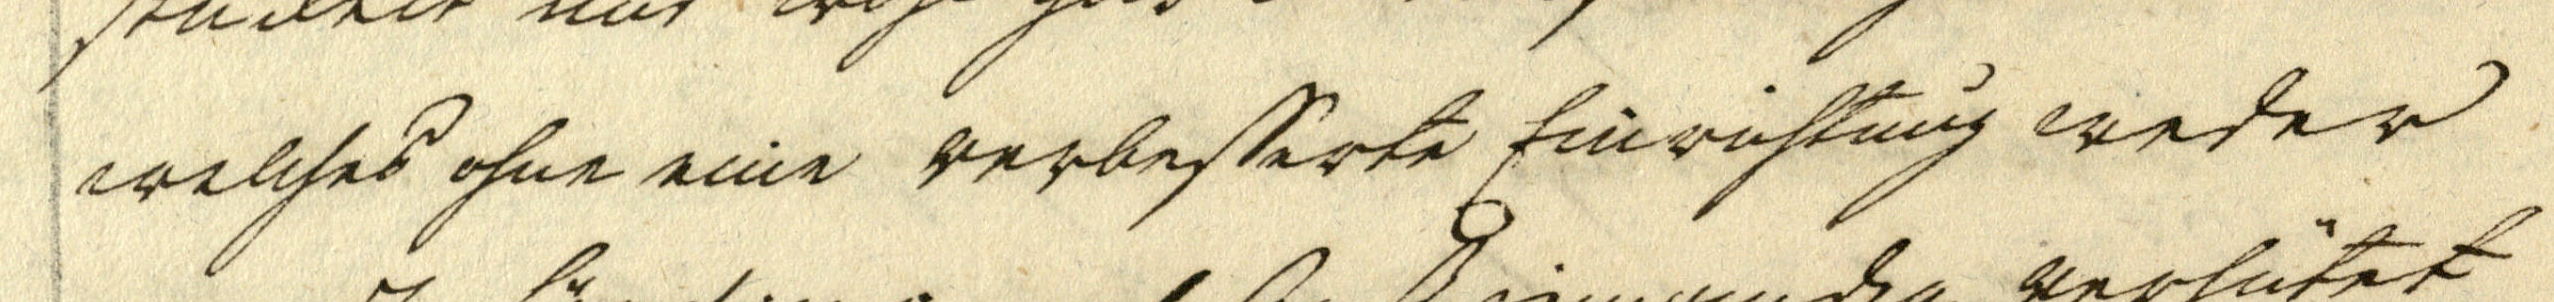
welches ohne eine verbesserte Einrichtung weder
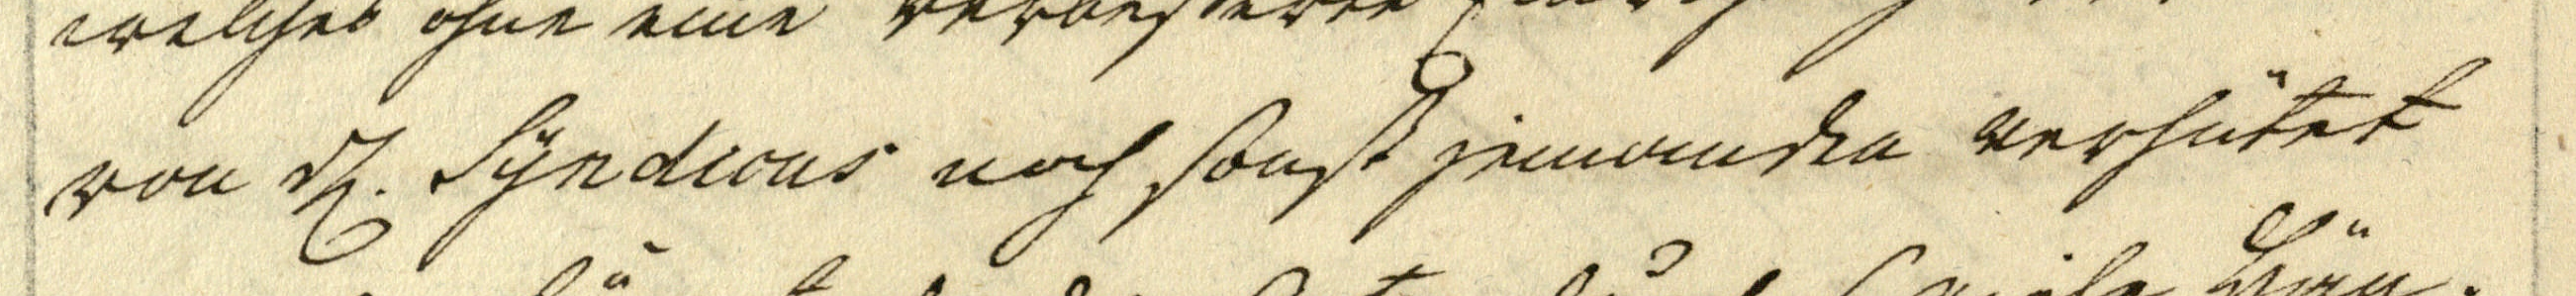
von dh. Sÿndicus noch sonst jemanden verhütet
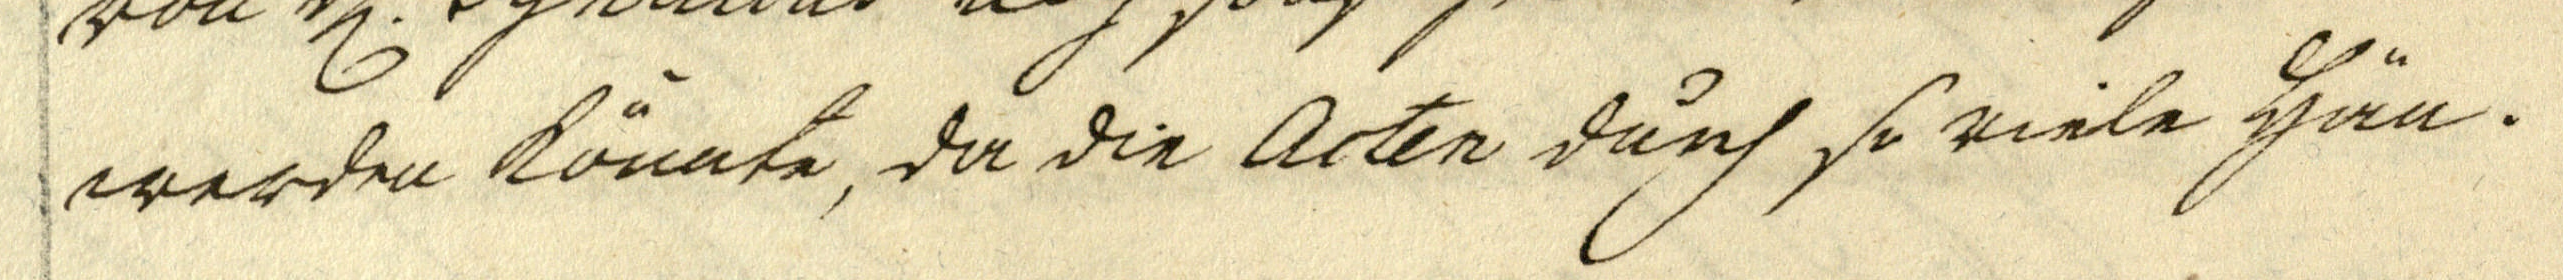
werden könnte, da die Acten durch so viele Hän¬
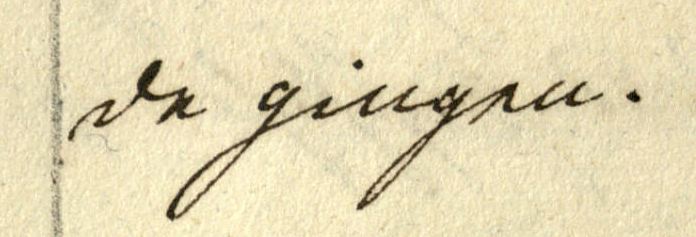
de gingen.
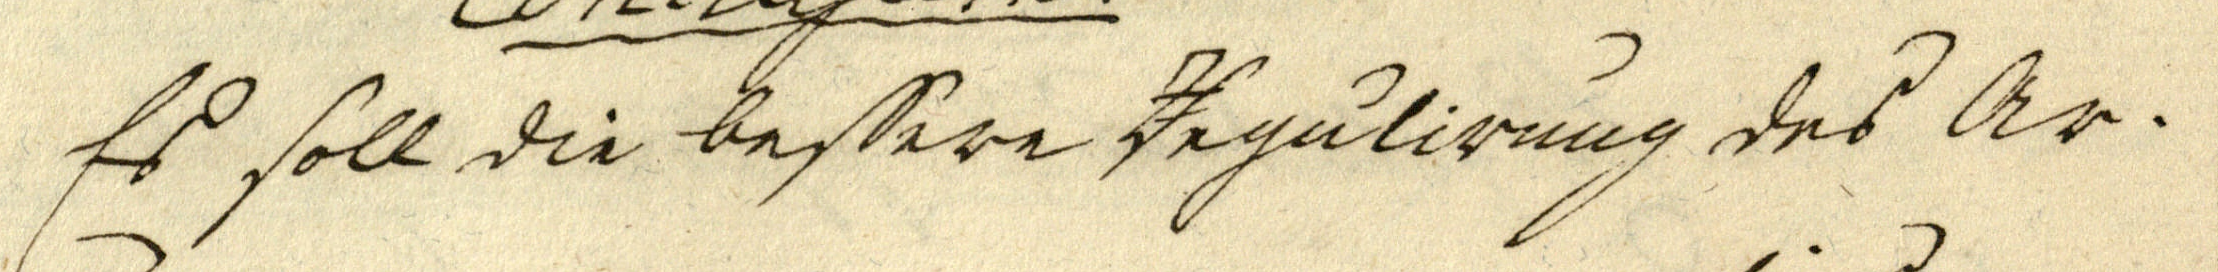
Es soll die bessere Regulirung des Ar¬
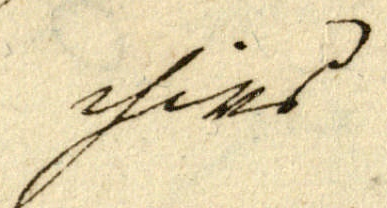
chivs
